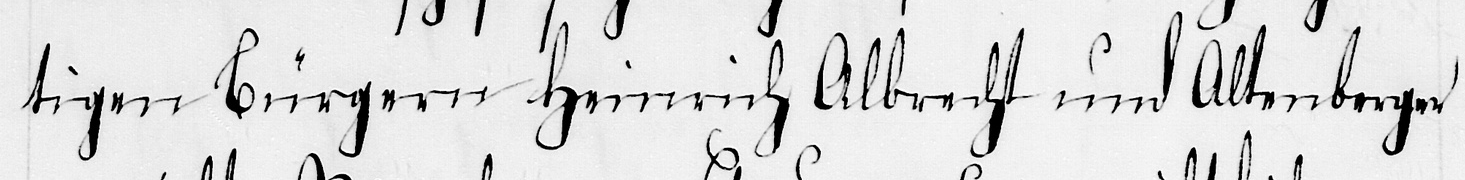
tigen Bürgern Heinrich Albrecht und Altenberger
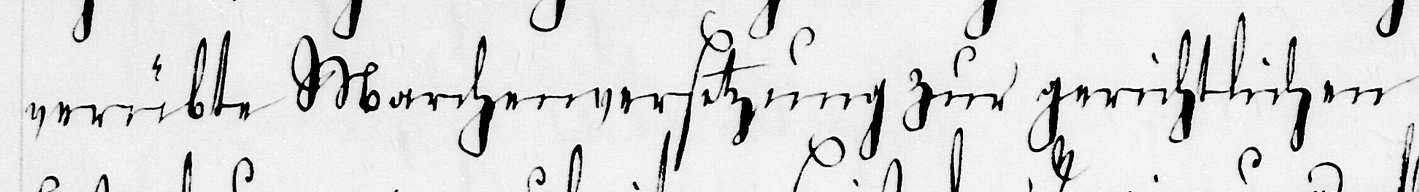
verübte Marchenversetzung zur gerichtlichen
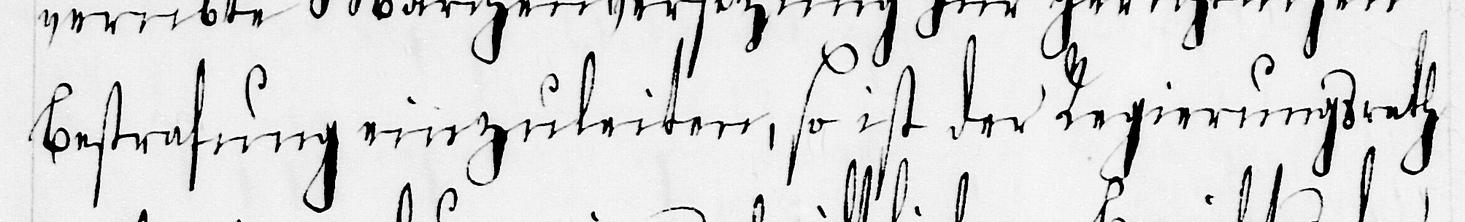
Bestrafung einzuleiten, so ist der Regierungsrath
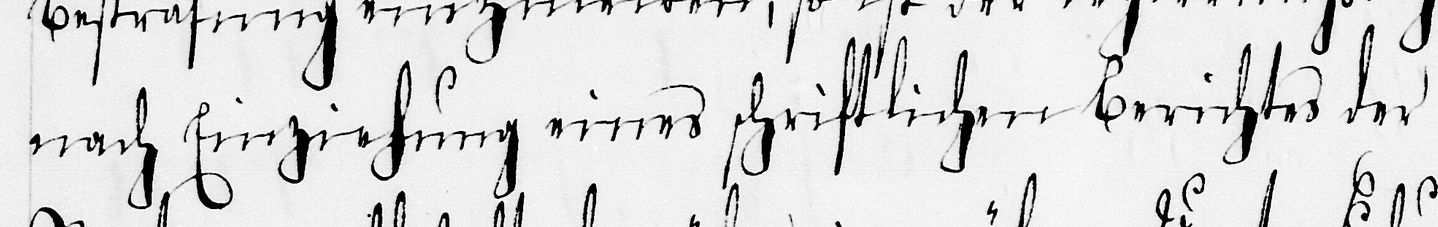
nach Einziehung eines schriftlichen Berichtes der
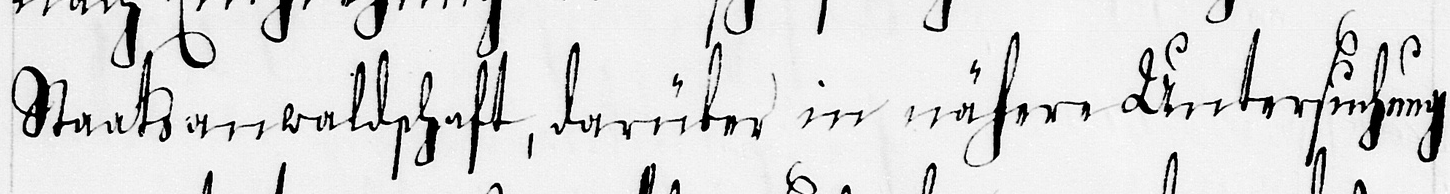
Staatsanwaldschaft, darüber in nähere Untersuchung
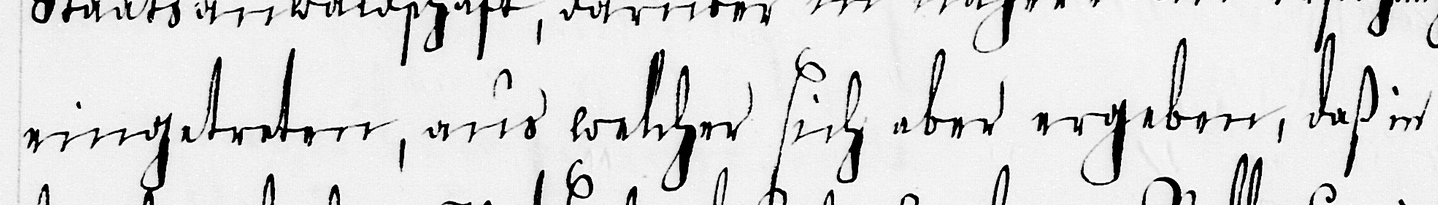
eingetreten, aus welcher sich aber ergeben, daß in
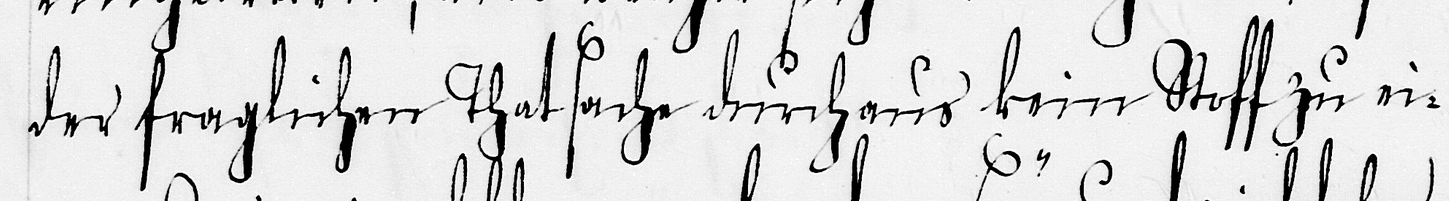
der fraglichen Thatsache durchaus kein Stoff zu ei¬
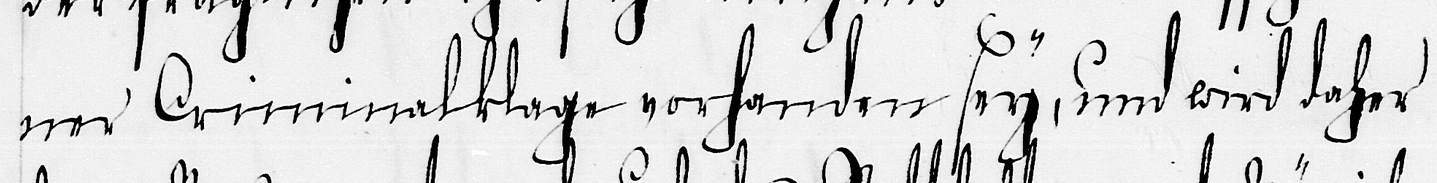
ner Criminalklage vorhanden sey, und wird daher
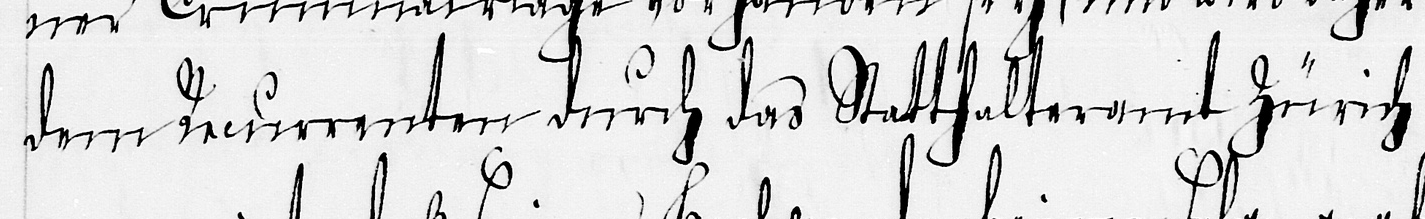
dem Recurrenten durch das Statthalteramt Zürich
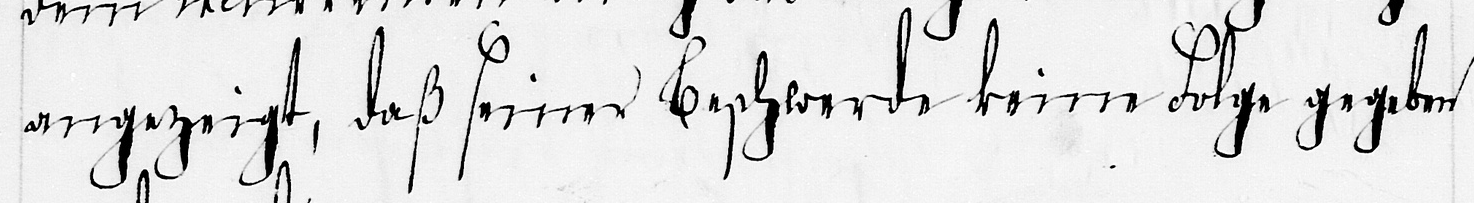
angezeigt, daß seiner Beschwerde keine Folge gegeben
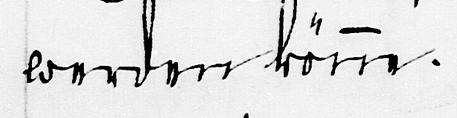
werden könne.
